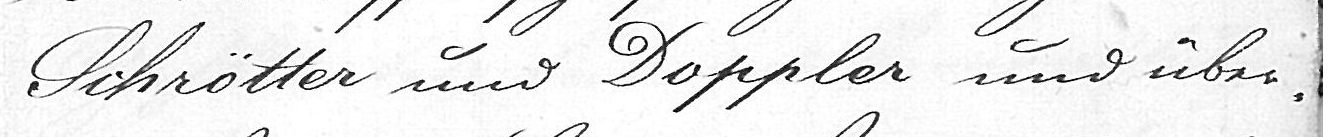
Schrötter und Doppler und über-
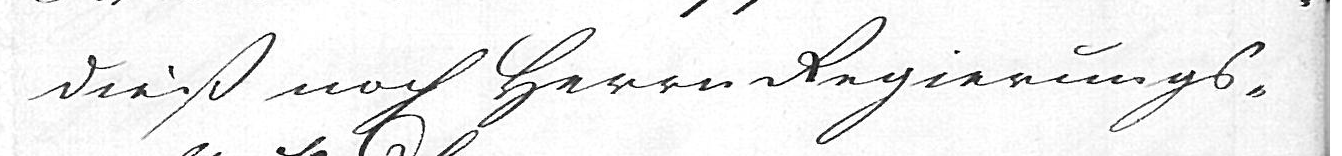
dieß noch Herrn Regierungs-
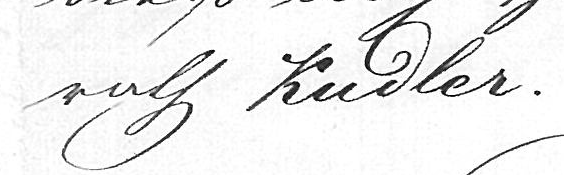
rath Kudler.
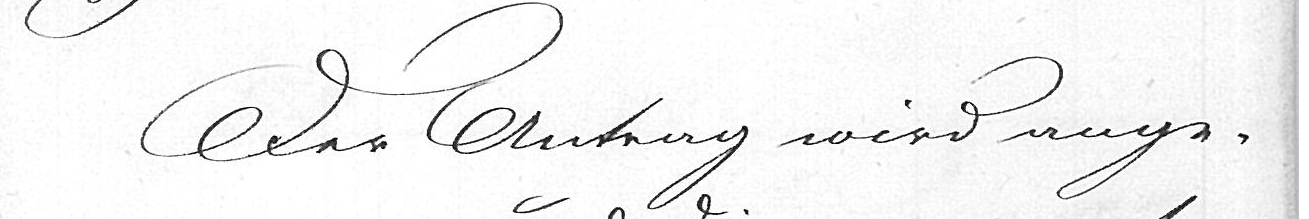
Der Antrag wird ange-
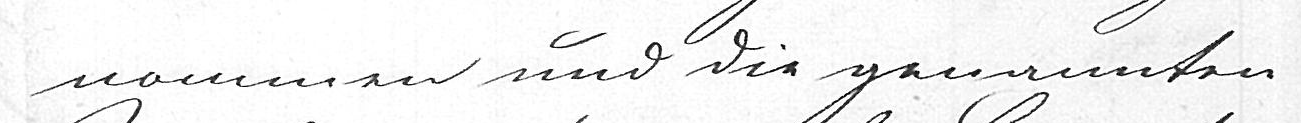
nommen und die genannten
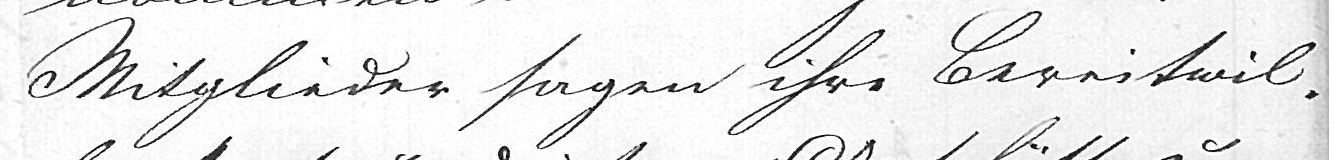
Mitglieder sagen ihre Bereitwil-
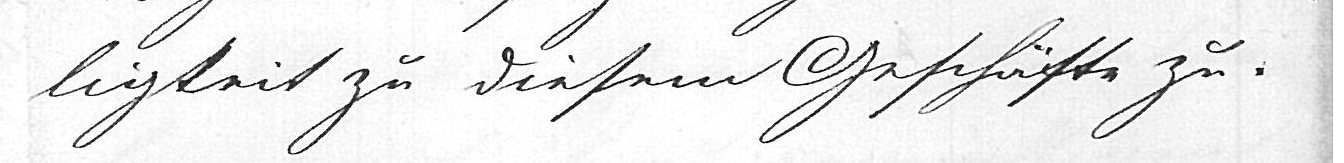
ligkeit zu diesem Geschäfte zu.
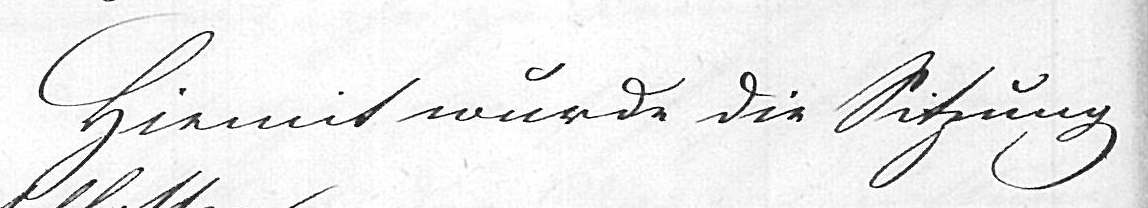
Hiemit wurde die Sitzung
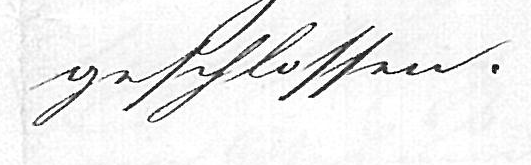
geschlossen.
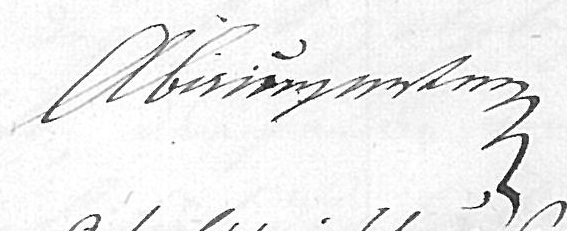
ABaumgartner
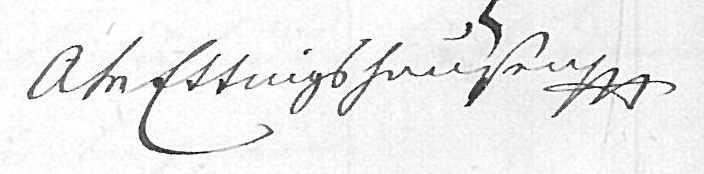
AvEttingshausen
